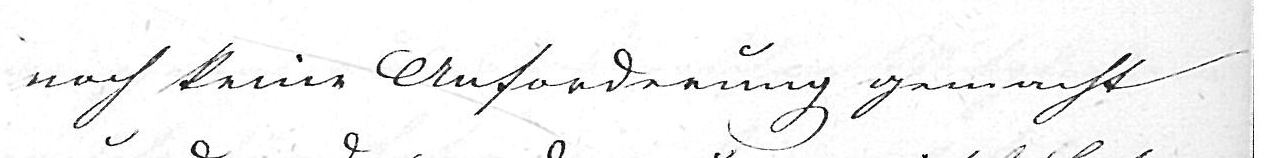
noch keine Anforderung gemacht
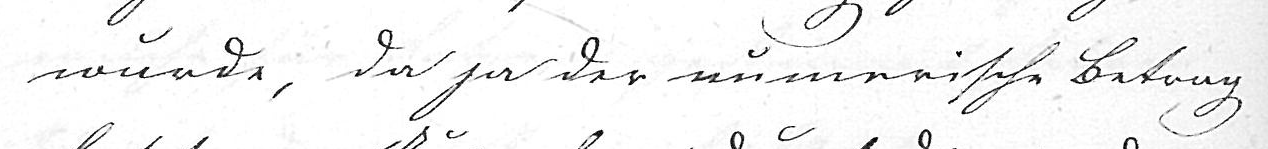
wurde, da ja der numerische Betrag
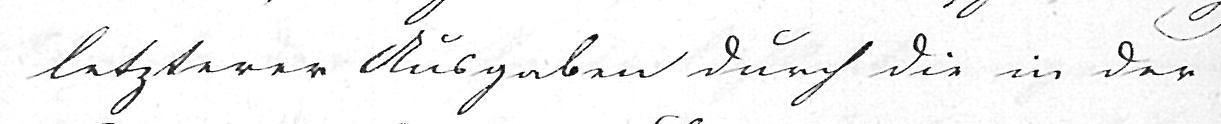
letzterer Ausgaben durch die in der
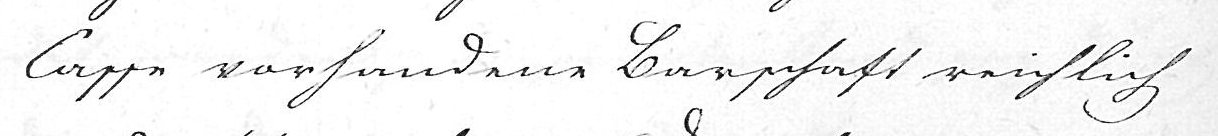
Casse vorhandene Barschaft reichlich
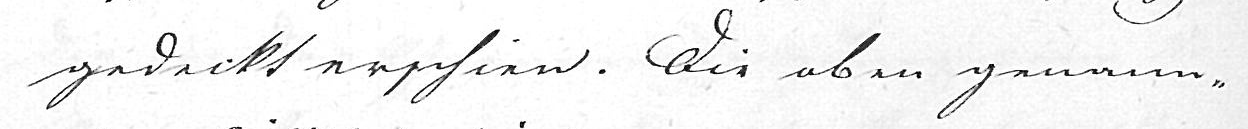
gedeckt erschien. Die oben genann-
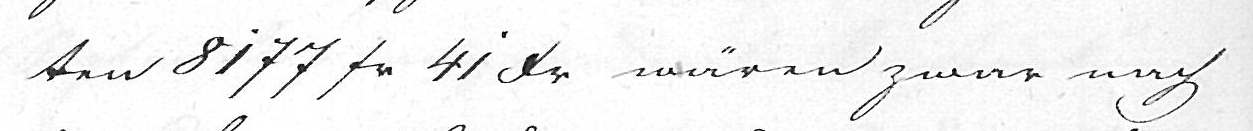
ten 8177 fr 41 kr wären zwar nach
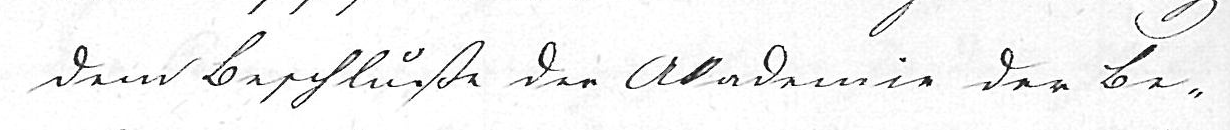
dem Beschlusse der Akademie der Be-
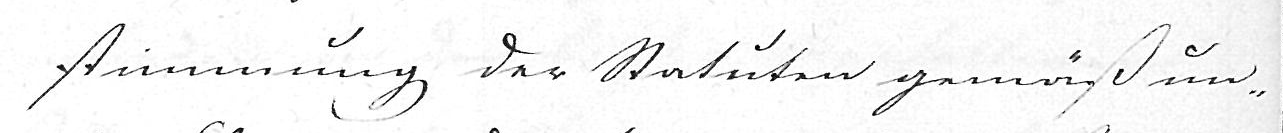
stimmung der Statuten gemäß un-
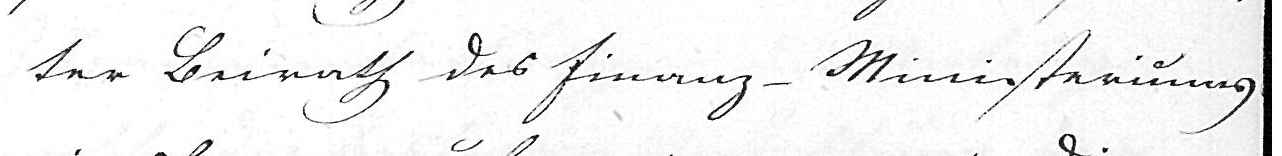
ter Beirath des Finanz-Ministeriums
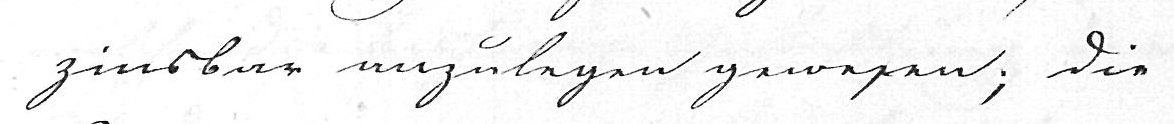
zinsbar anzulegen gewesen; die
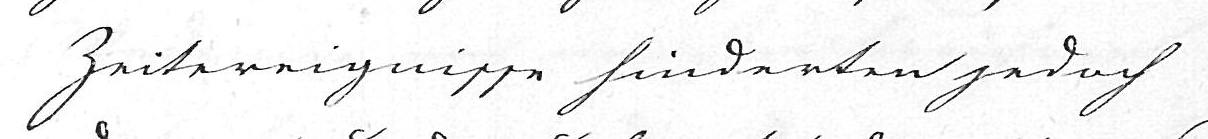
Zeitereignisse hinderten jedoch
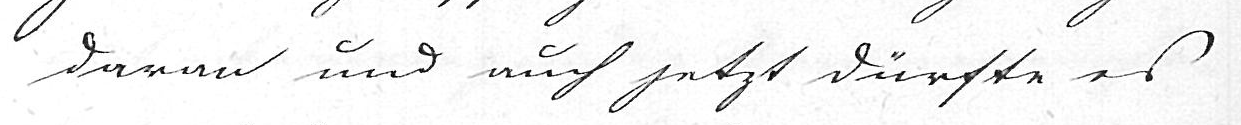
daran und auch jetzt dürfte es
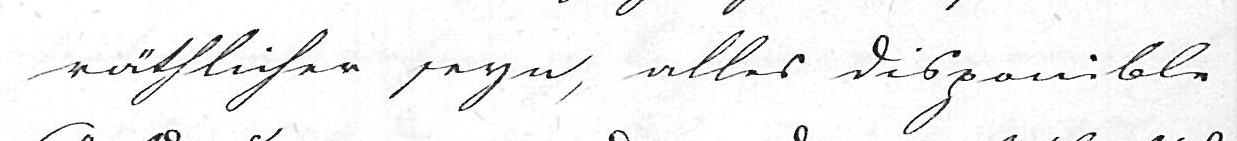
räthlicher seyn, alles disponible
